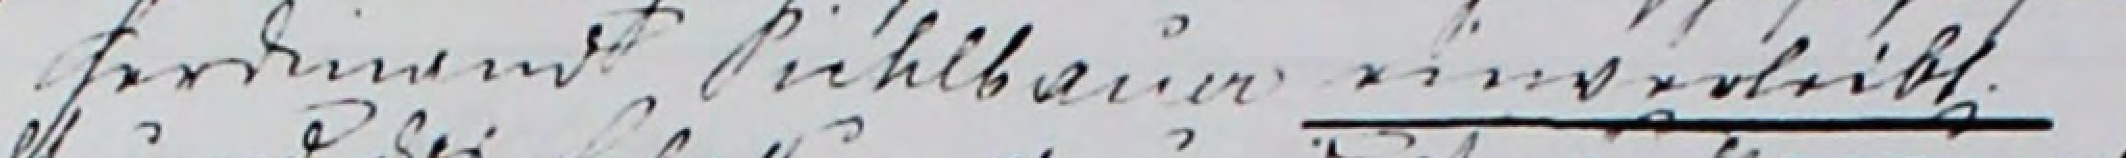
Ferdinand Pichlbauer einverleibt.
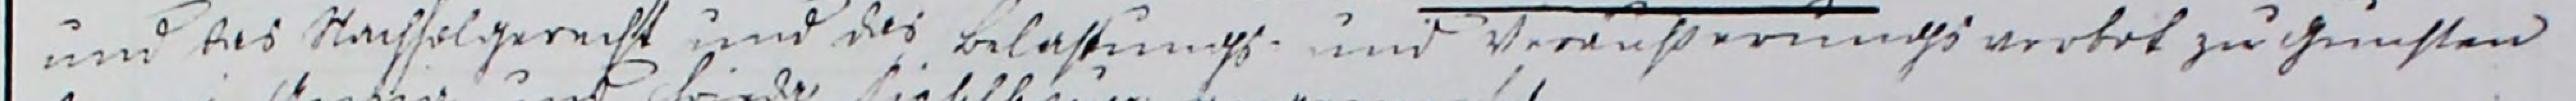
und das Nachholgerecht und das Belastungs- und Veräußerungsverbot zu Gunsten
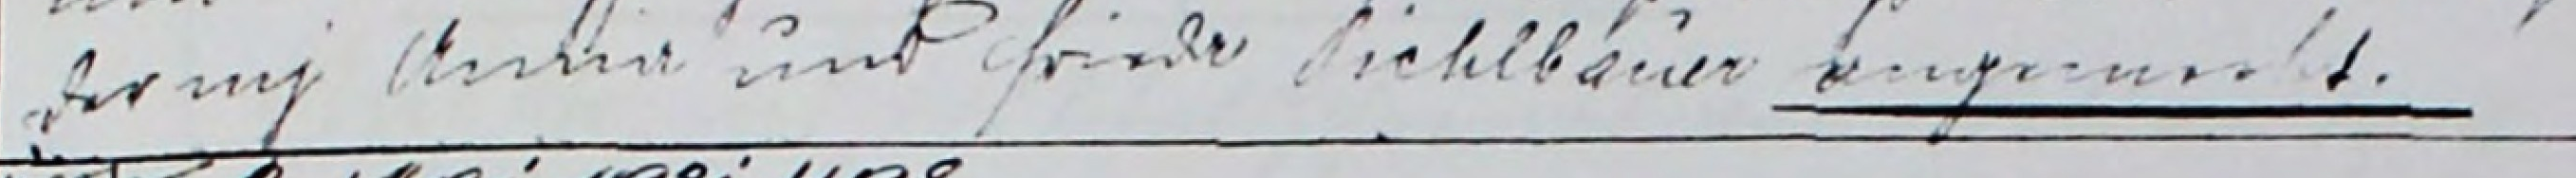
der mj Anna und Frida Pichlbauer angemerkt.
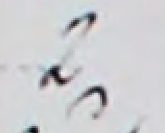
2
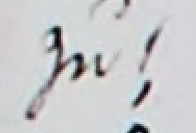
zu 1,
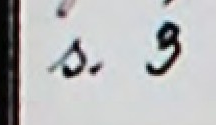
s. 3
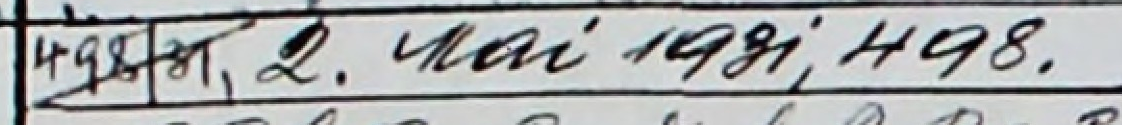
498/31, 2. Mai 1931. 498.
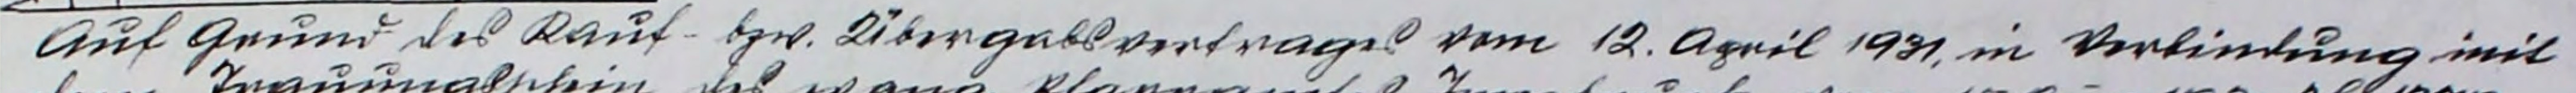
Auf Grund des Kauf - bzw. Übergabsvertrages vom 12. April 1931, in Verbindung mit
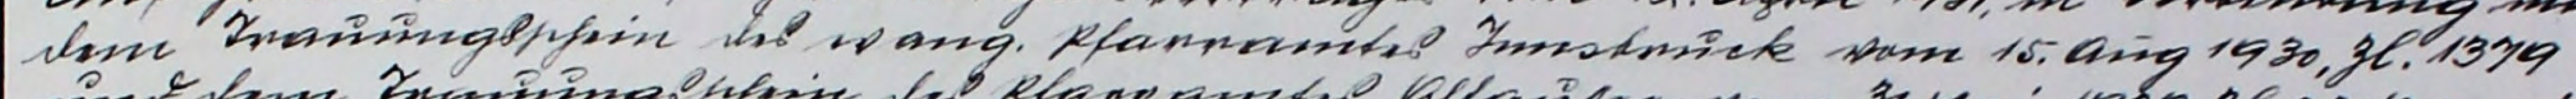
dem Trauungsphein des wang. Pfarramtes Innstruck vom 15. Aug 1930, Zl. 1379
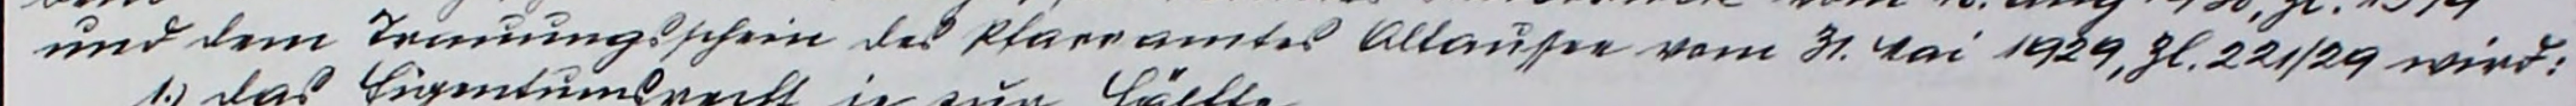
und dem Trauungsschein des Pfarramtes Altaussee vom 31. Mai 1929, Zl. 221/29 wird:
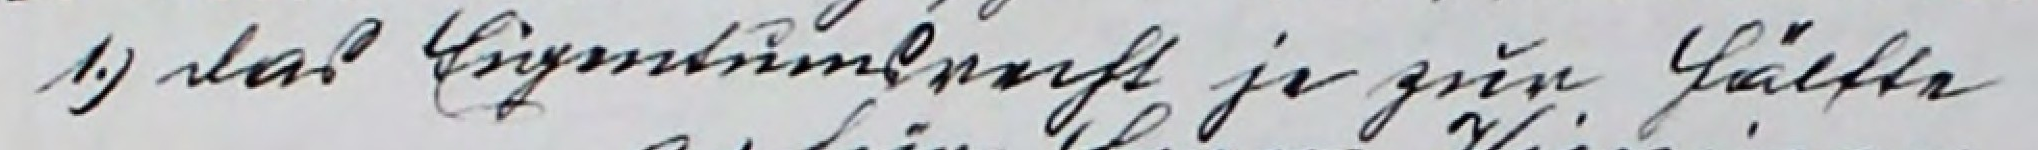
1.) das Eigentumsrecht je zur Hälfte
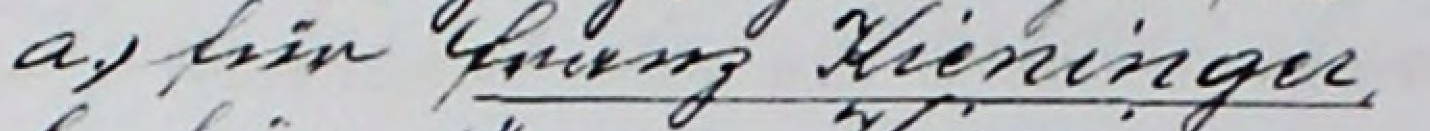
a.) für Franz Kieninger,
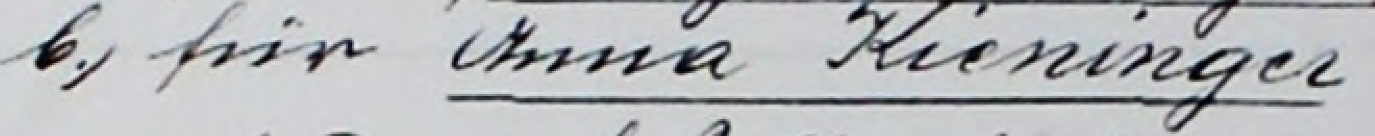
b.) für Anna Kieninger einverleibt,
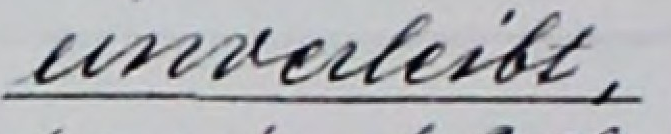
2.) die Anmerkung des Nachholgerechtes sowie des Veräußerungs- und Be=
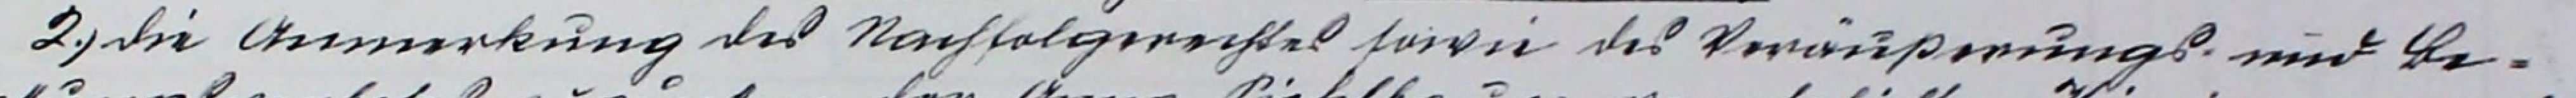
lastungsverbotes zugunsten der Anna Pichlbauer verehelichten Kieninger und
